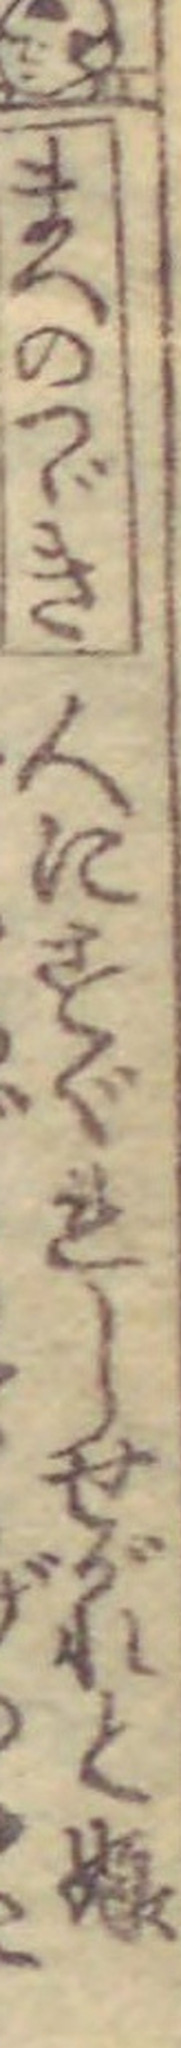「まへのつゞき」人にすぐれしせがれと娘
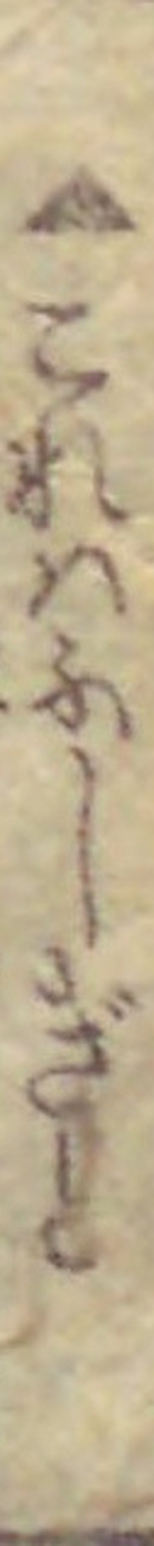▲これはふしぎと
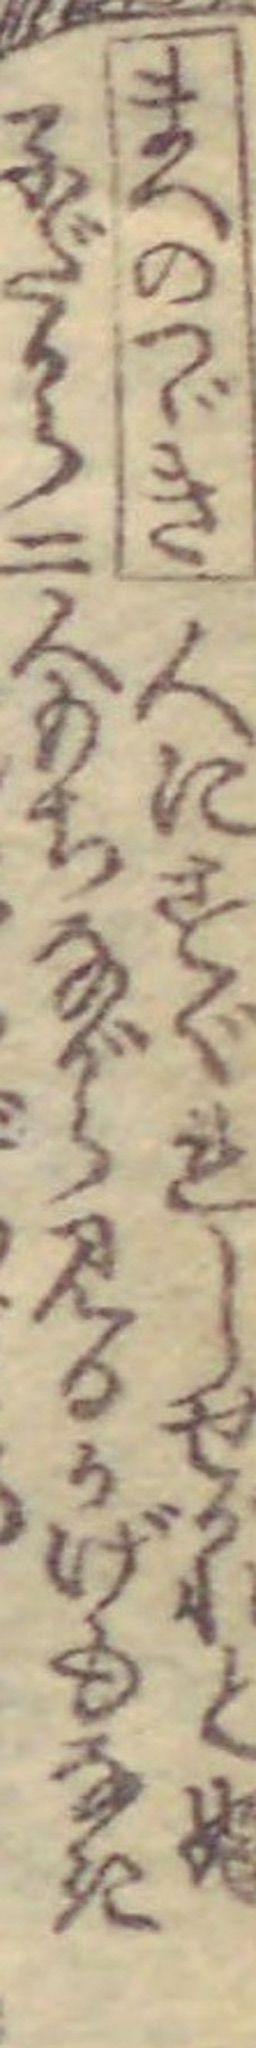子だから二人もちながら見るかげもなき
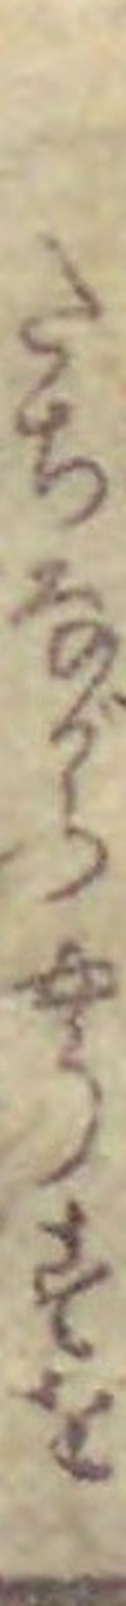たちながらやうすを
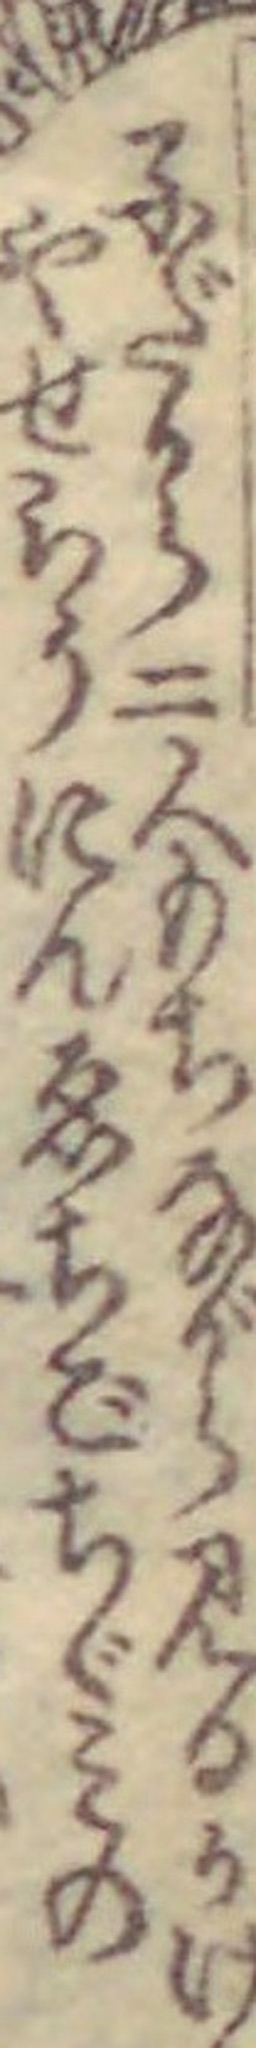やせらうにんゑちごちゞみの
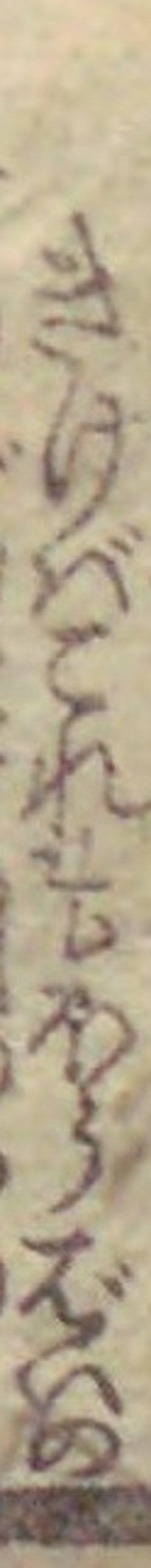きけばこれもほうばいの
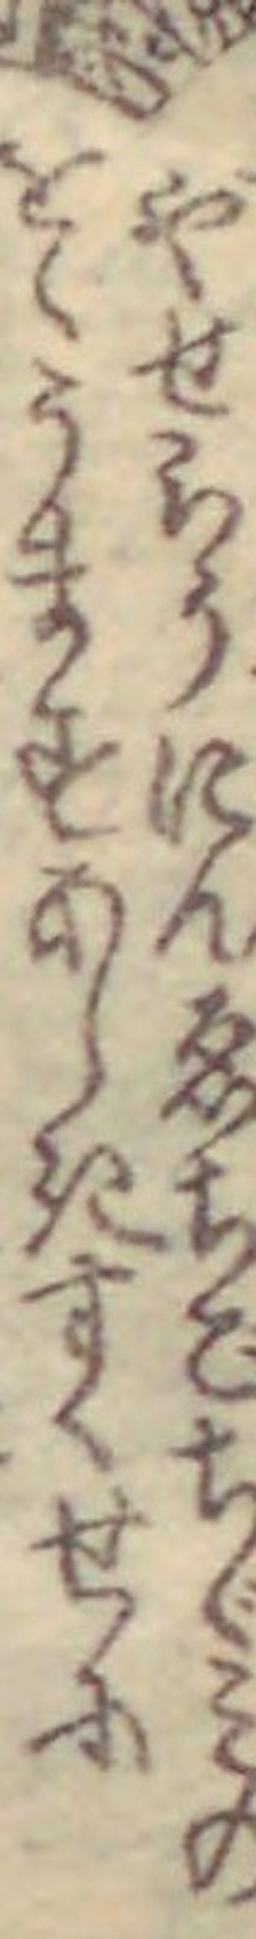をくうますあしきすくせに
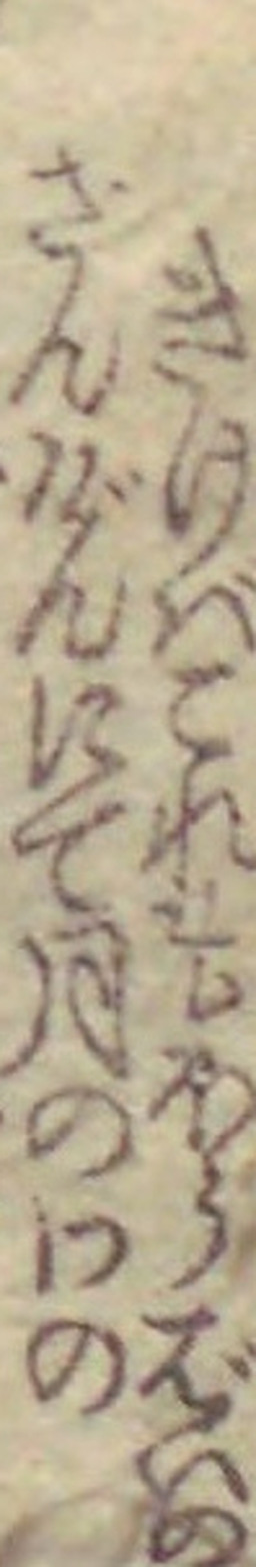ざんげんにて月のわの
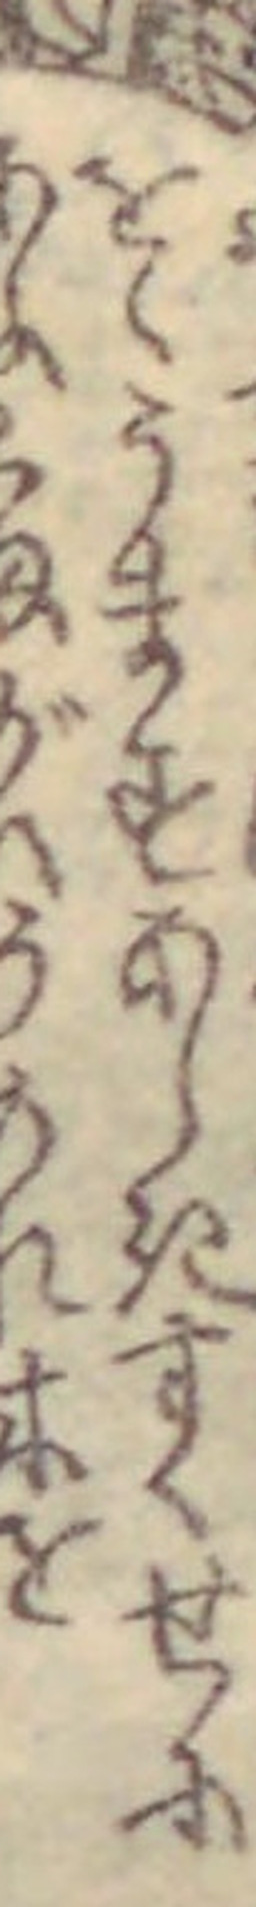あふくまがはうもれ木を
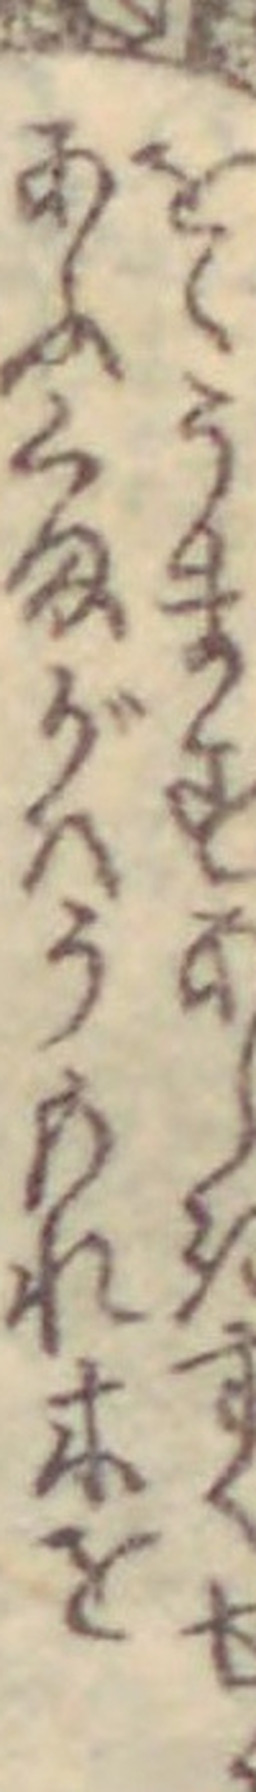あふくまがはうもれ木を
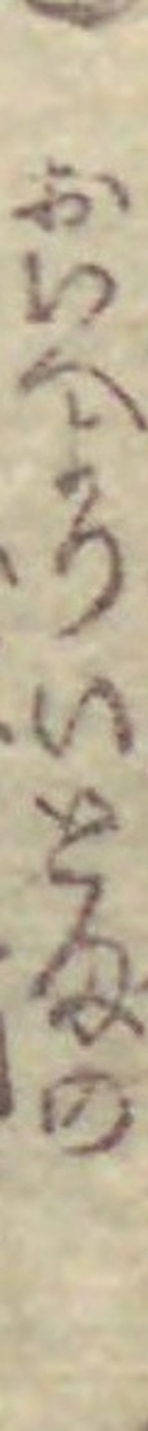おいへよりいとまの
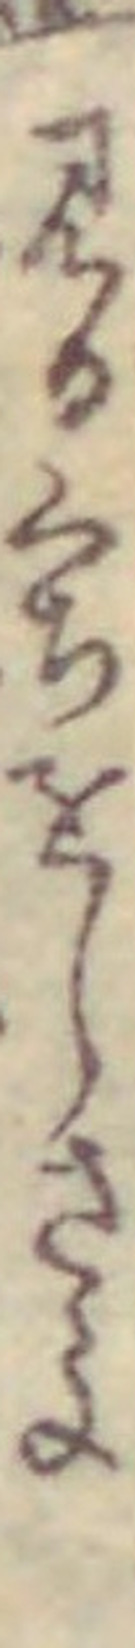見るくちおしさよ
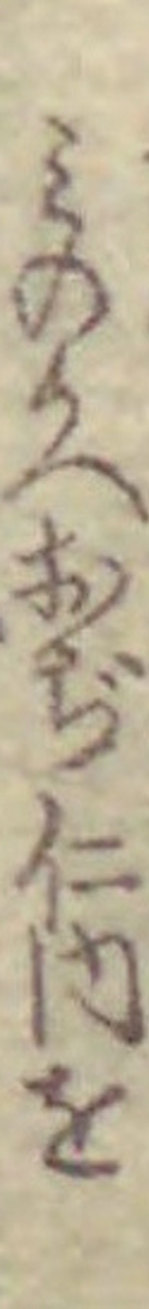みのうへおじ仁内を
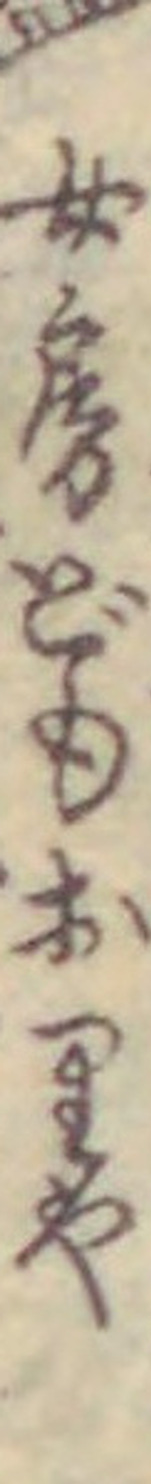女房どもおりや
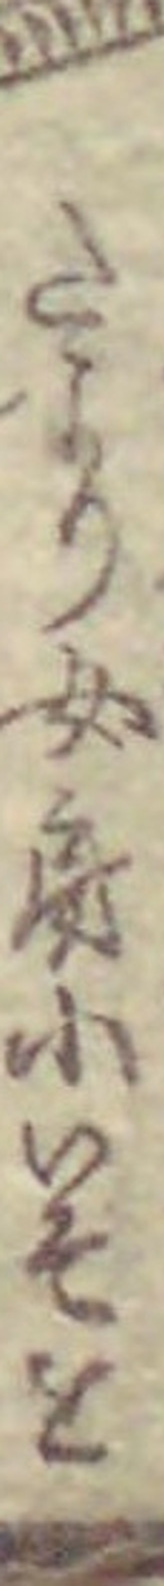たより女房小いそを
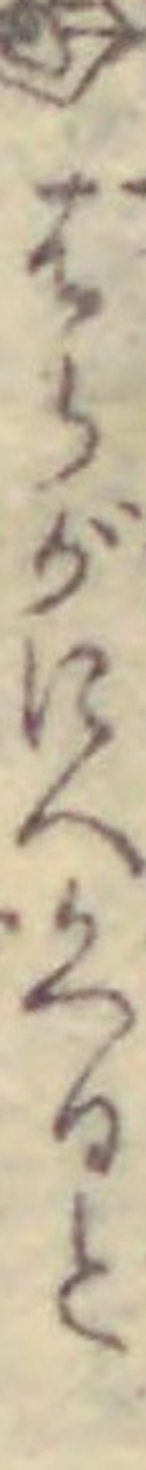はらがにへかへると
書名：八ツ目鱣因縁物語 3巻
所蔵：国立国会図書館 National Diet Library, JAPAN
